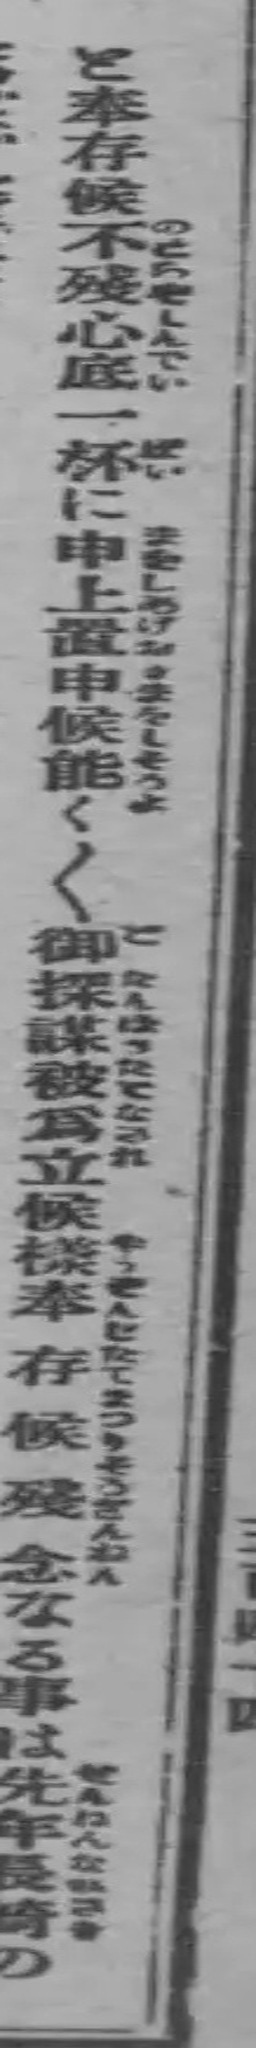と奉存候不残心底一杯に申上置申候能く〳〵御探謀被為立候様奉存候残念なる事は先年長崎の
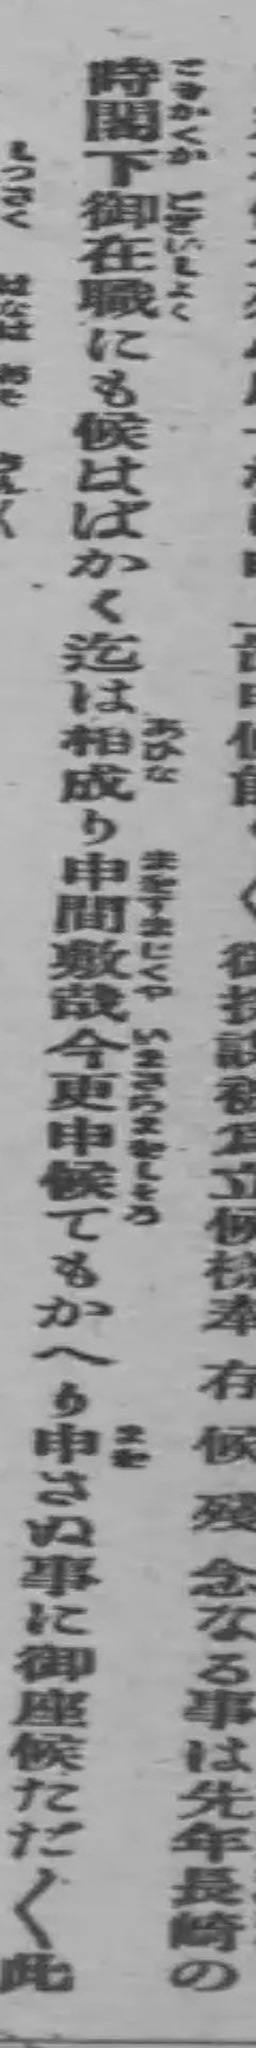時閣下御在職にも候はばかく迄は相成り申間敷哉今更申候てもかへり申さぬ事に御座候ただ〳〵此
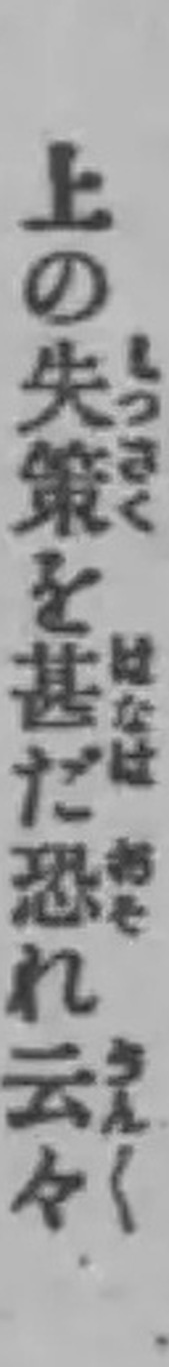上の失策を甚だ恐れ云々
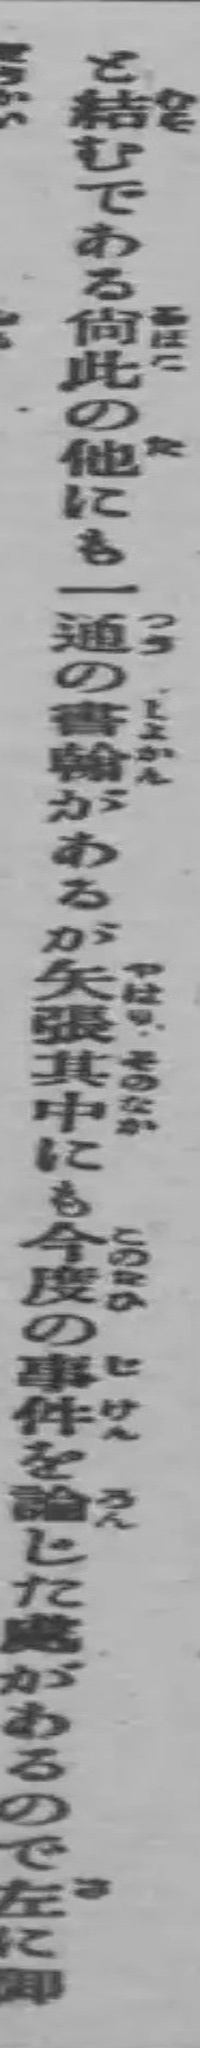と結むである尚此の他にも一通の書翰があるが矢張其中にも今度の事件を論じた処があるので左に御
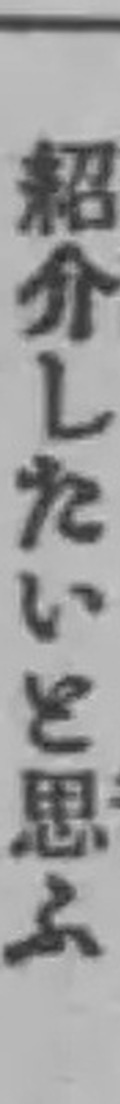紹介したいと思ふ
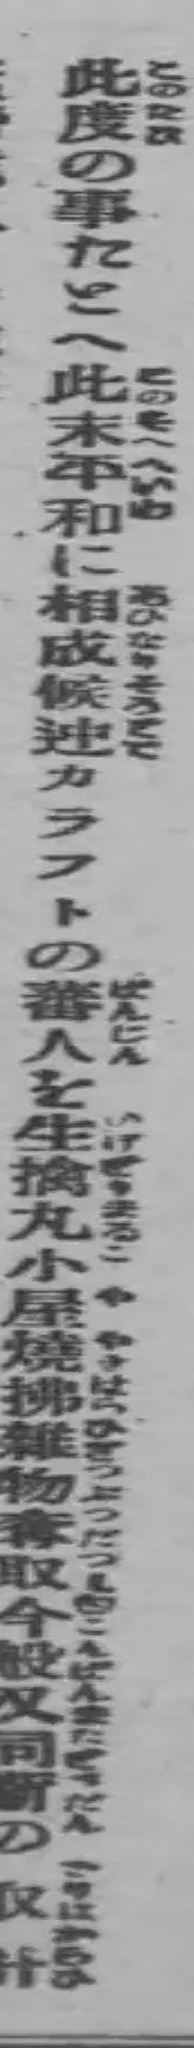此度の事たとへ此末平和に相成候迚カラフトの蕃人を生擒丸小屋焼払雑物奪取今般又同断の取計
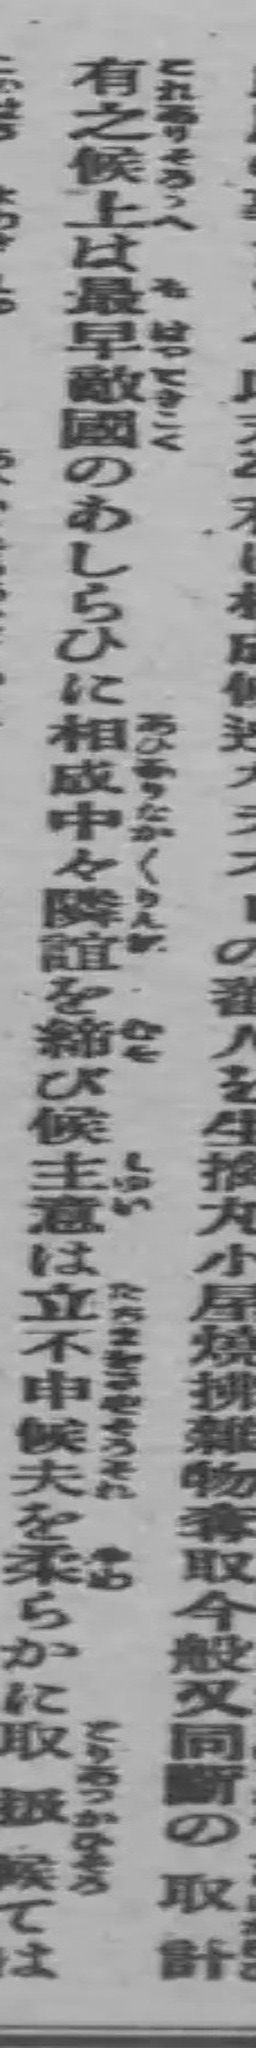有之候上は最早敵国のあしらひに相成中々隣誼を結び候主意は立不申候夫を柔らかに取扱候ては
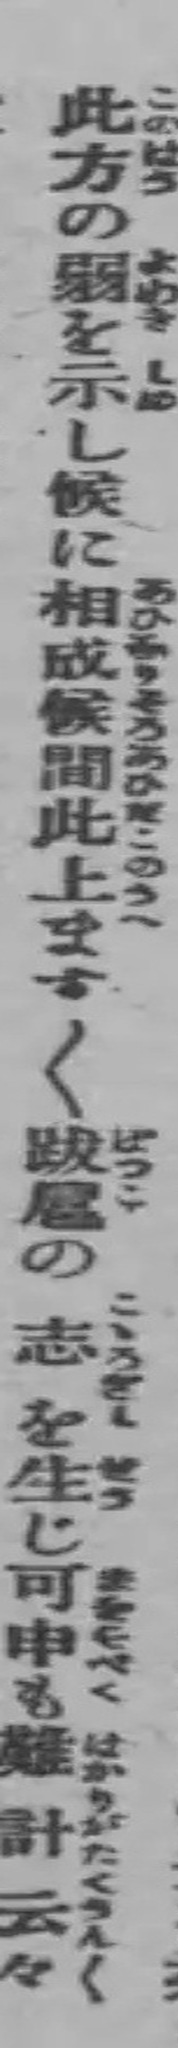此方の弱を示し候に相成候間此上ます〳〵跋扈の志を生じ可申も難計云々
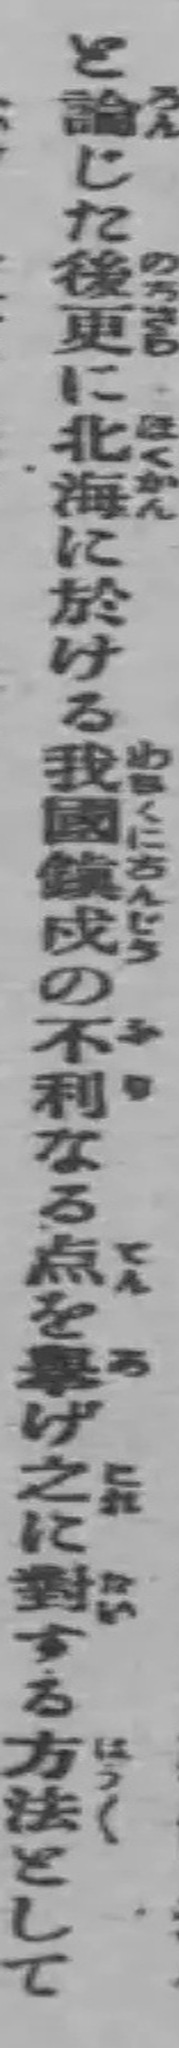と論じた後更に北海に於ける我国鎮戌の不利なる点を挙げて之に対する方法として
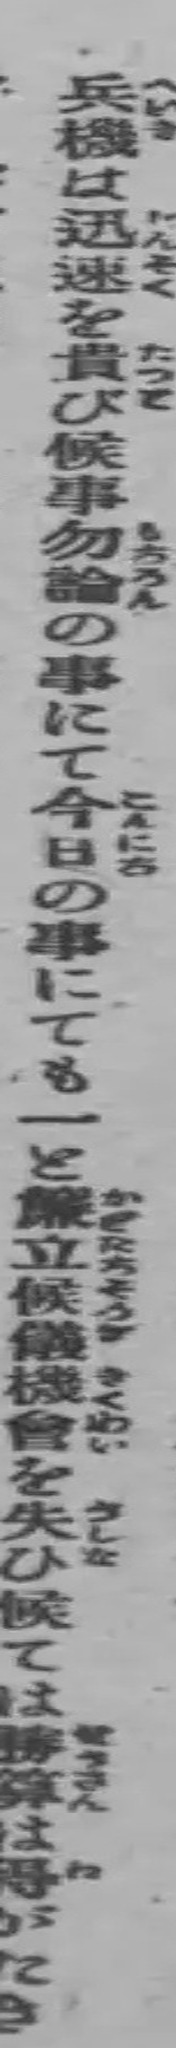兵機は迅速を貴び候事勿論の事にて今日の事にても一と廉立候儀機会を失ひ候ては勝算は得がたき
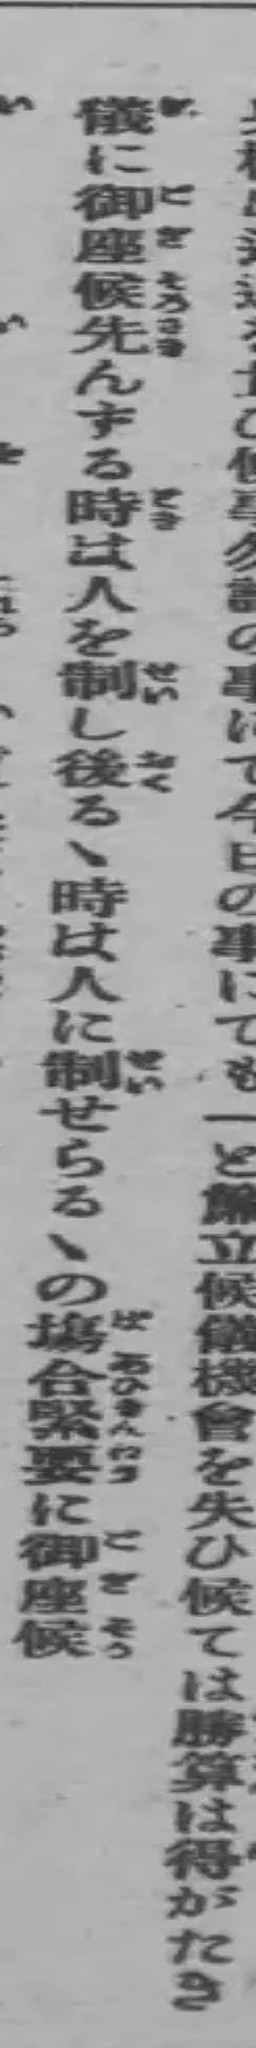儀に御座候先んずる時は人を制し後るゝ時は人に制せらるゝの場合緊要に御座候
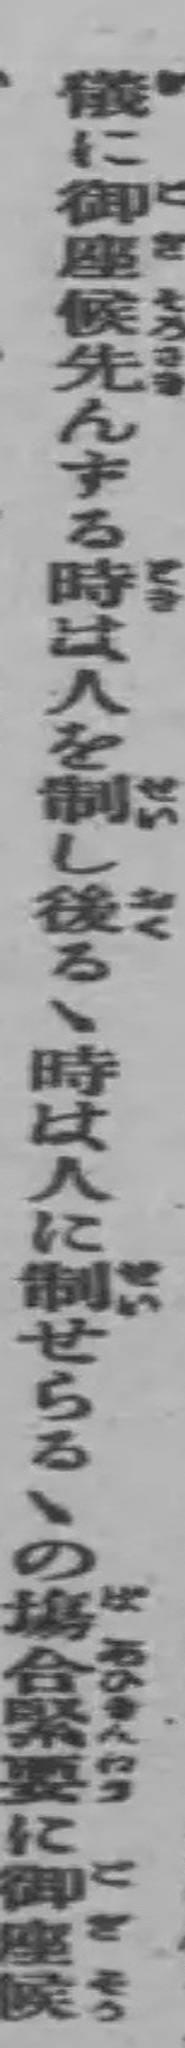儀に御座候先んずる時は人を制し後るゝ時は人に制せらるゝの場合緊要に御座候
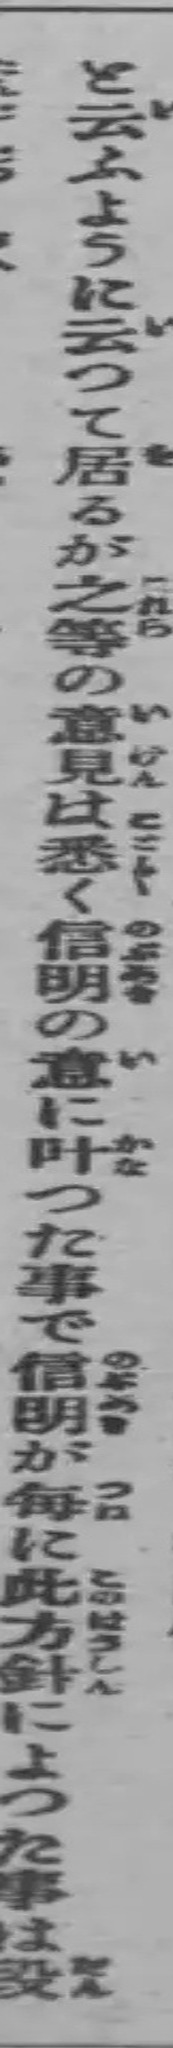と云ふように云つて居るが之等の意見は悉く信明の意に叶つた事で信明が毎に此方針によつた事は段
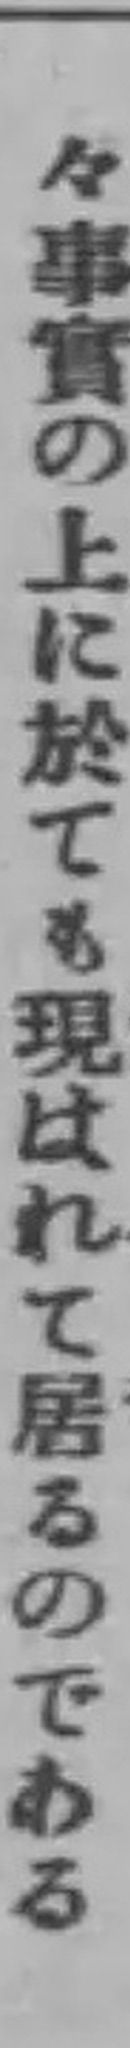段事実の上に於ても現はれて居るのである
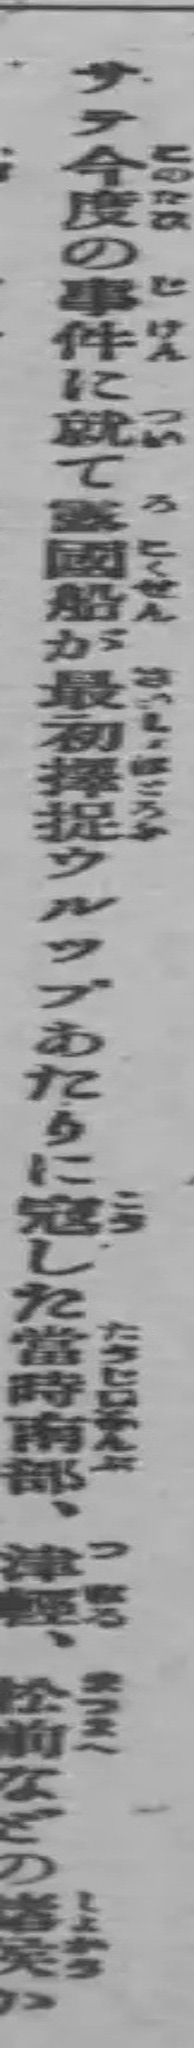サテ今度の事件に就て露国船が最初択捉ウルツプあたりに寇した当時南部、津軽、松前などの諸侯か
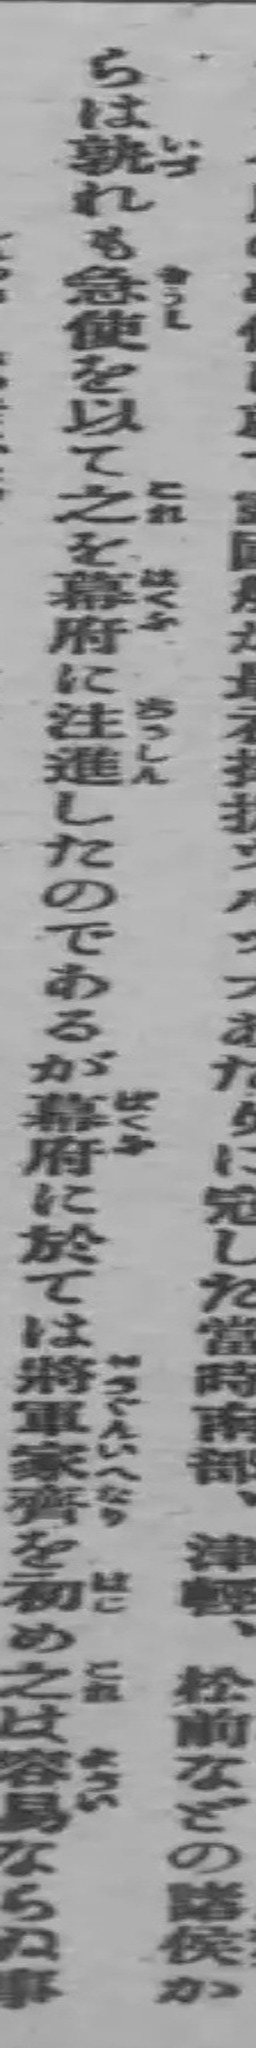らは孰れも急使を以て之を幕府に注進したのであるが幕府に於ては将軍家斉を初め之は容易ならぬ事
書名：豊橋市史談
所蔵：国立国会図書館 National Diet Library, JAPAN
